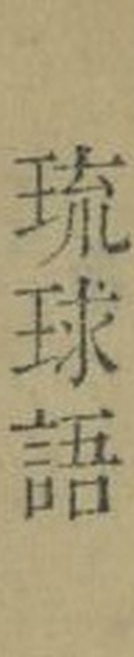琉球語
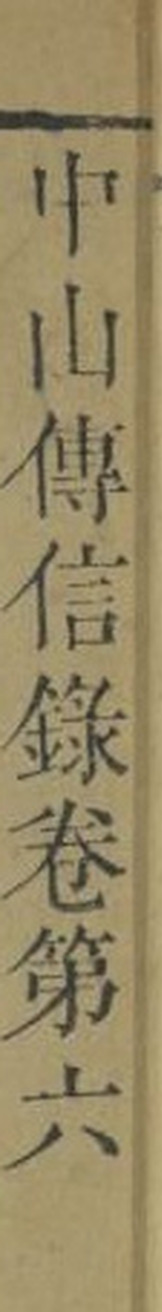中山伝信録巻第六
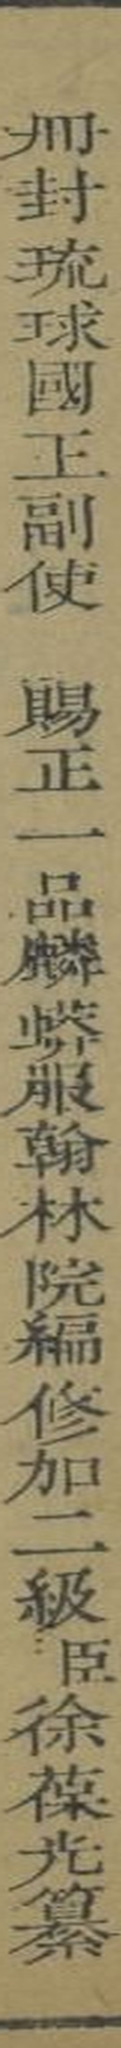冊封琉球国王副使賜正一品麟蟒服翰林院編修加二級臣徐葆光纂
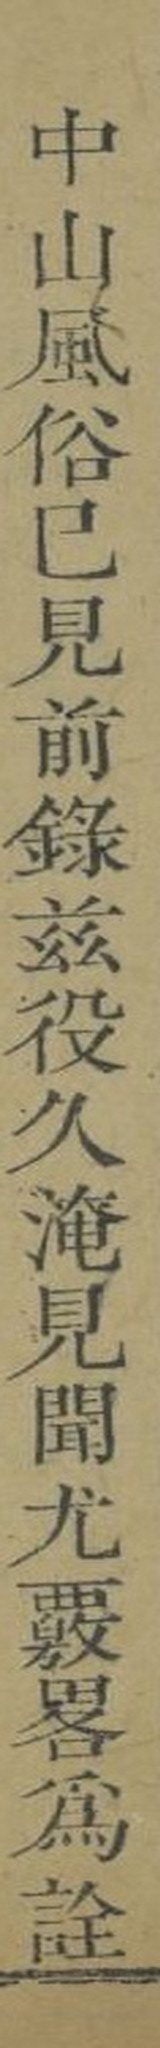中山風俗巳見前録茲役久淹見聞尤覈略為詮
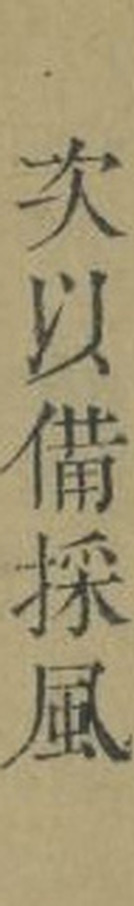次以備採風
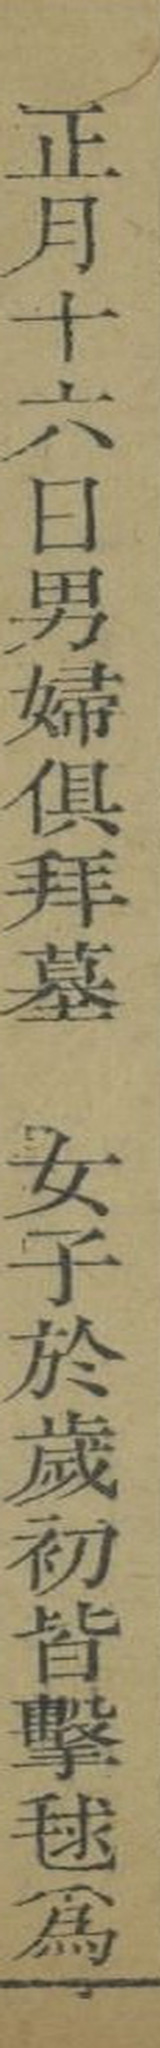正月十六日男婦倶拝墓女子於歳初皆撃毬為
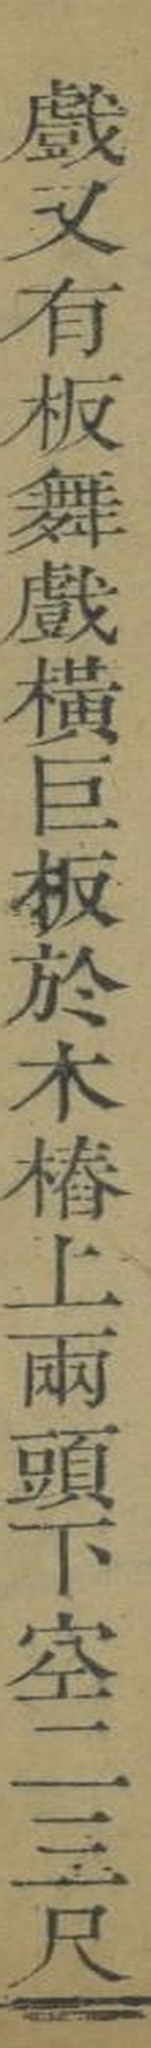戯又有板舞戯横巨板於木椿上両頭下空二三尺
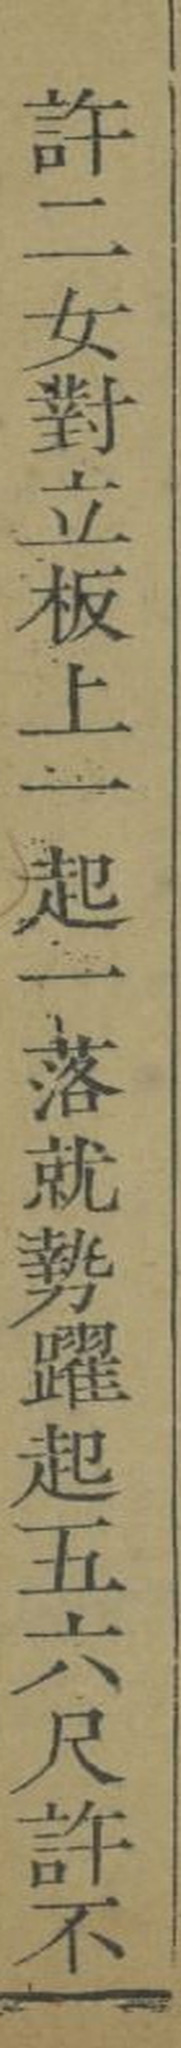許二女対立板上一起一落就勢躍起五六尺許不

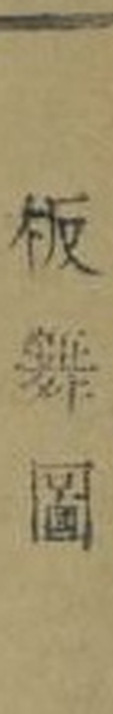板舞図
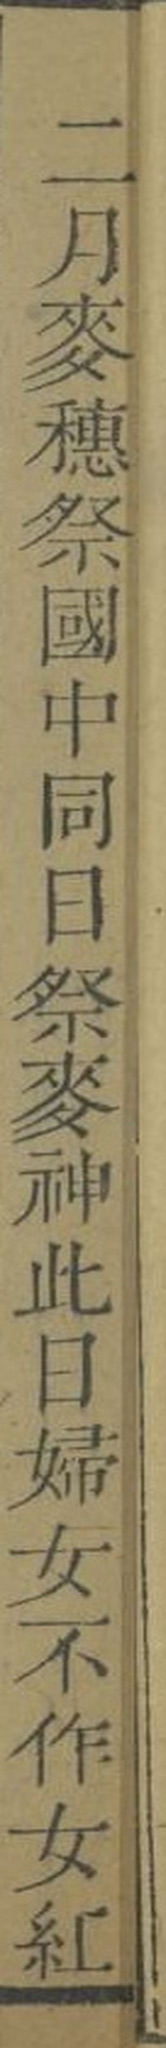二月麦穂祭国中同日祭麦神此日婦女不作女紅
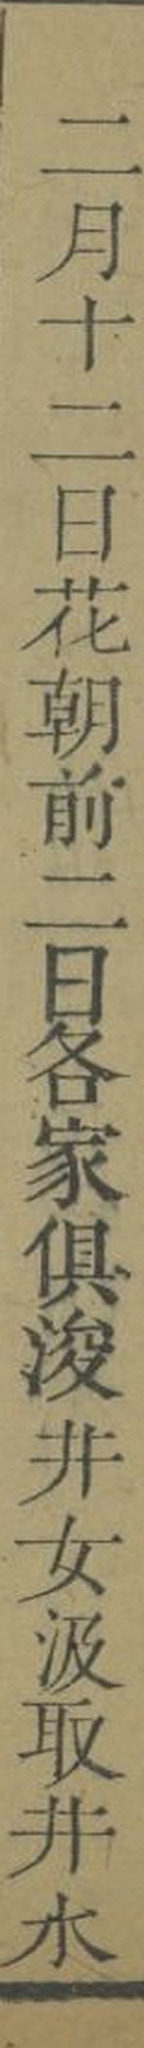二月十二日花朝前二日各家俱浚井女汲取井水
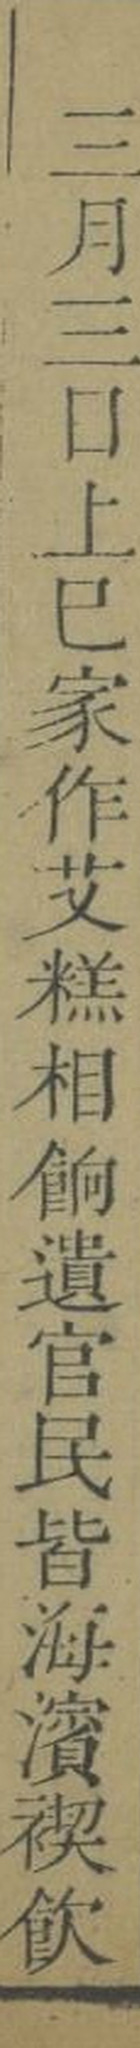三月三日上巳家作艾糕相餉遺官民皆海浜禊飲
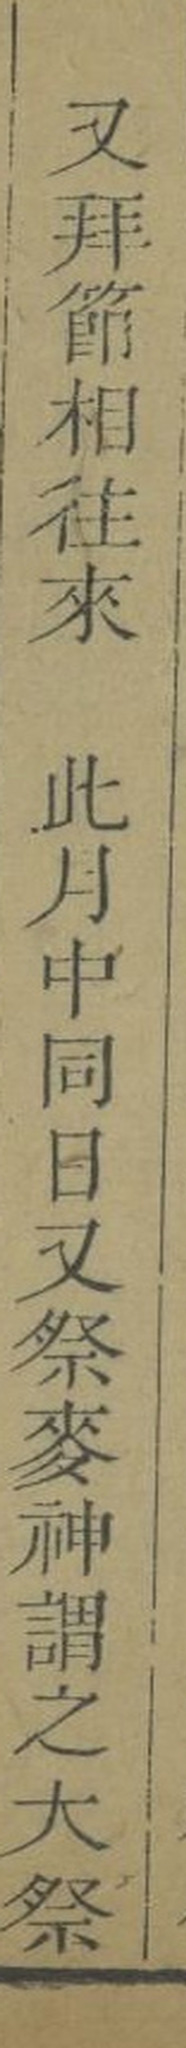又拝節相往来此月中同日又祭麦神謂之大祭
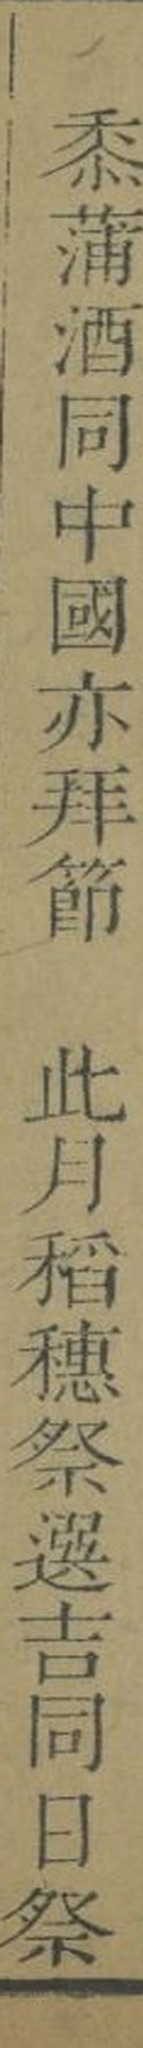黍蒲酒同中国亦拝節此月稲穂祭選吉同日祭
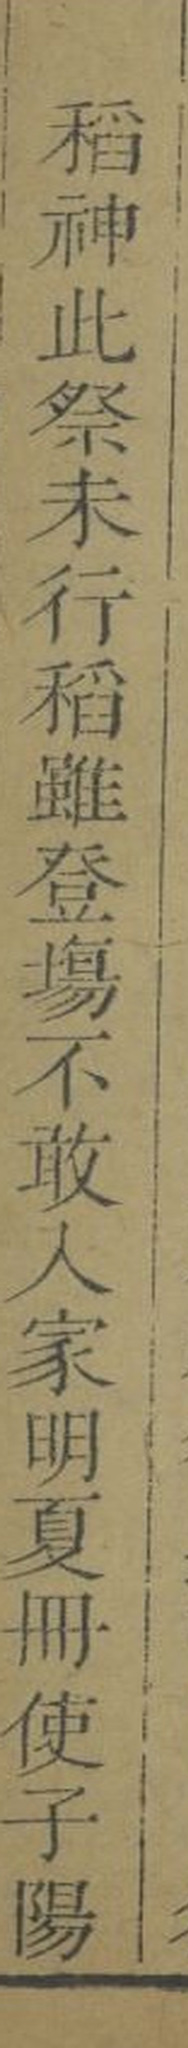稲神此祭未行稲雖登場不敢入家明夏冊使子陽

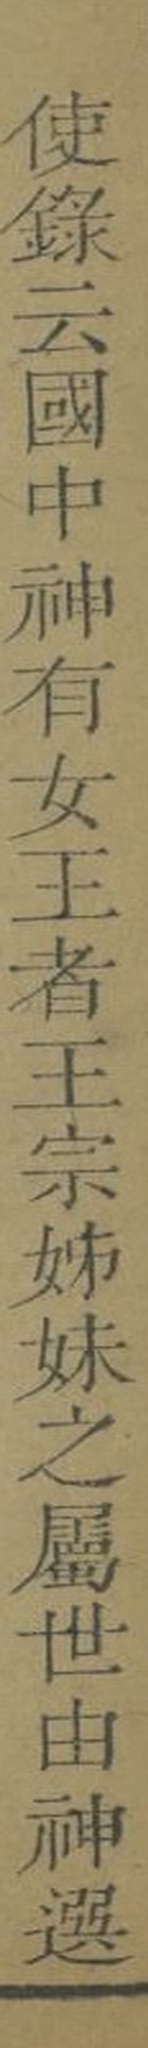使録云国中神有女王者王宗姉妹之属世由神選
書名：中山伝信録 巻六
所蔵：University of the Ryukyus Library
